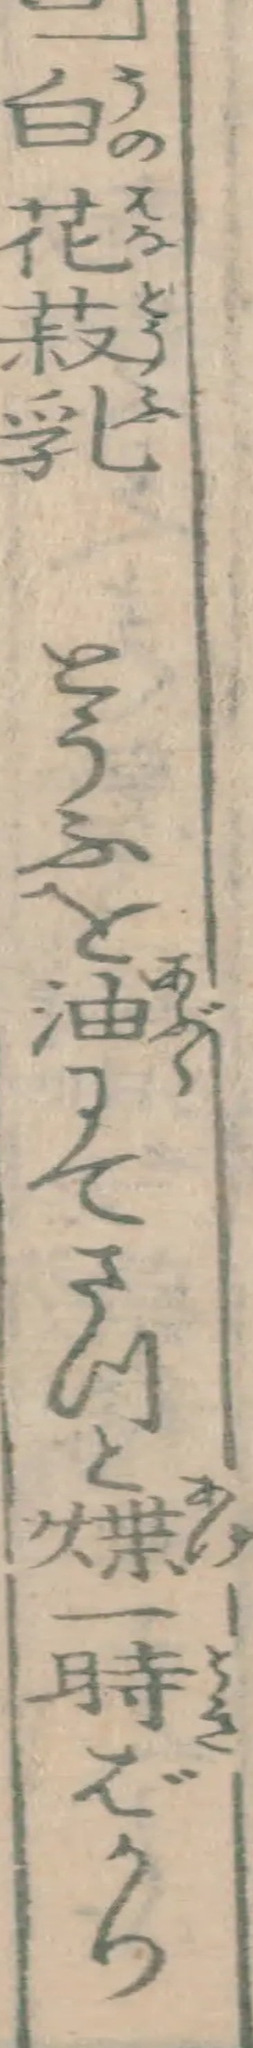廿四白花菽乳とうふを油にてさつと煠一時ばかり
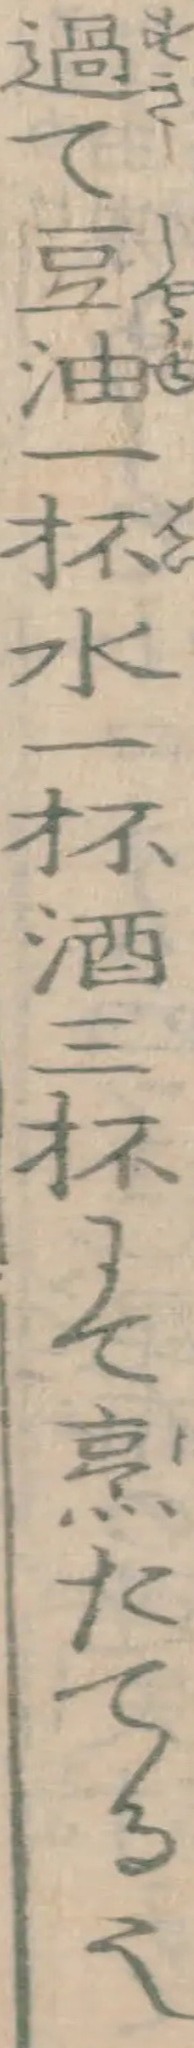過て豆油一杯水一杯酒三杯にて烹たてる也
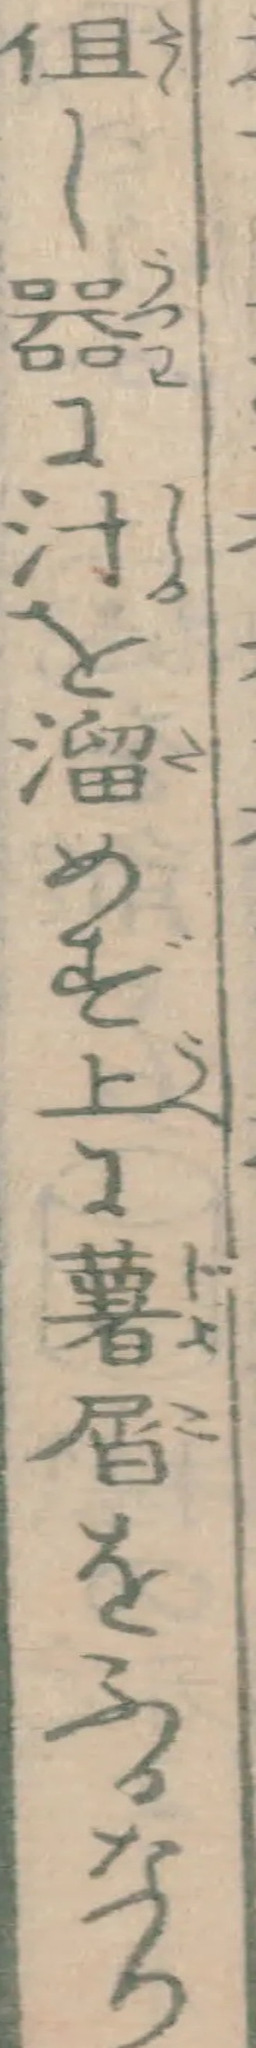但し器に汁を溜めす上に薯屑をふるなり
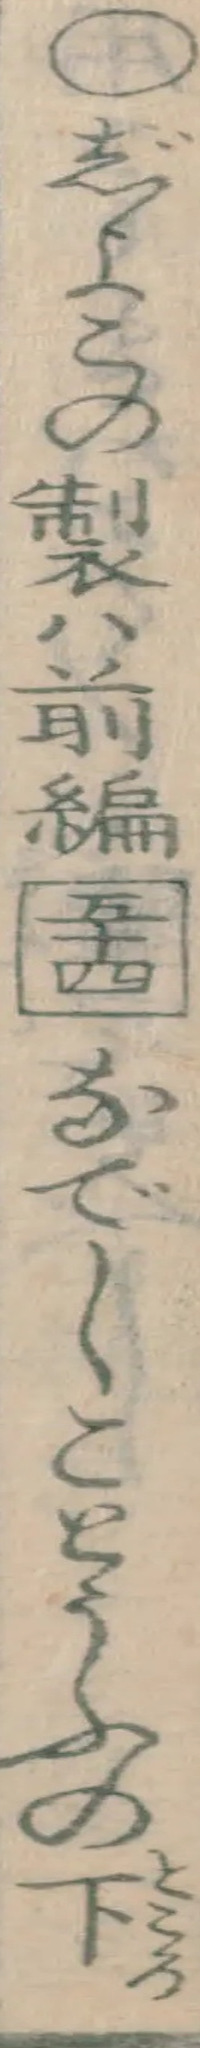○じよこの製は前編五十四なでしことうふの下
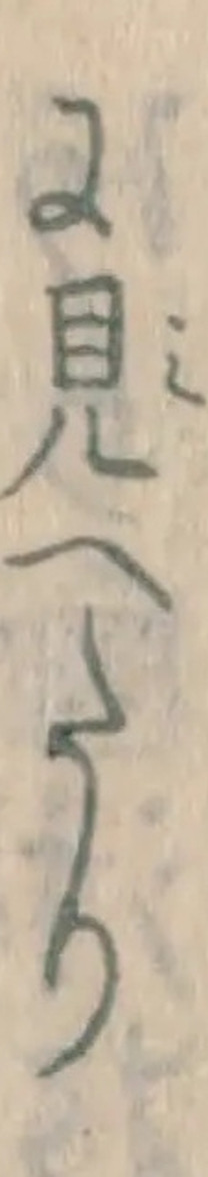に見へたり
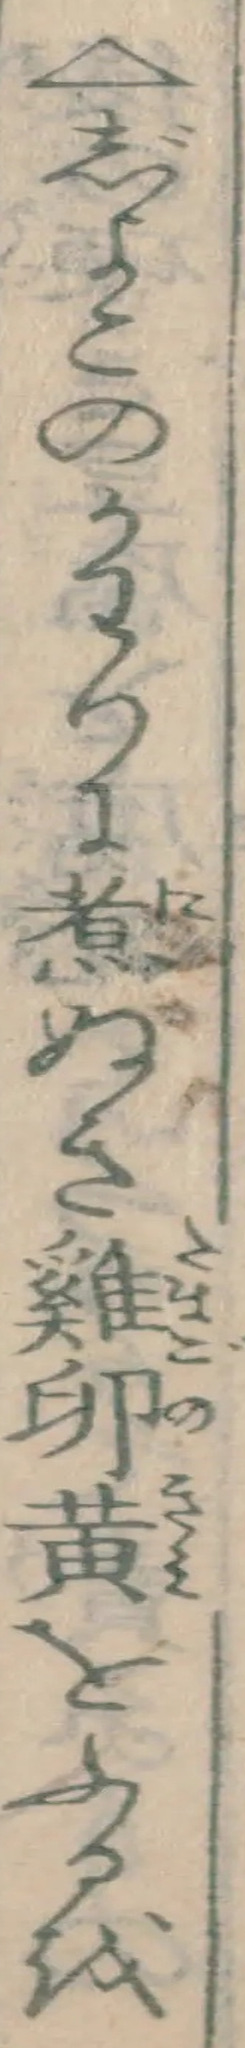△じよこのかわりに煮ぬき鶏卵黄をふるを
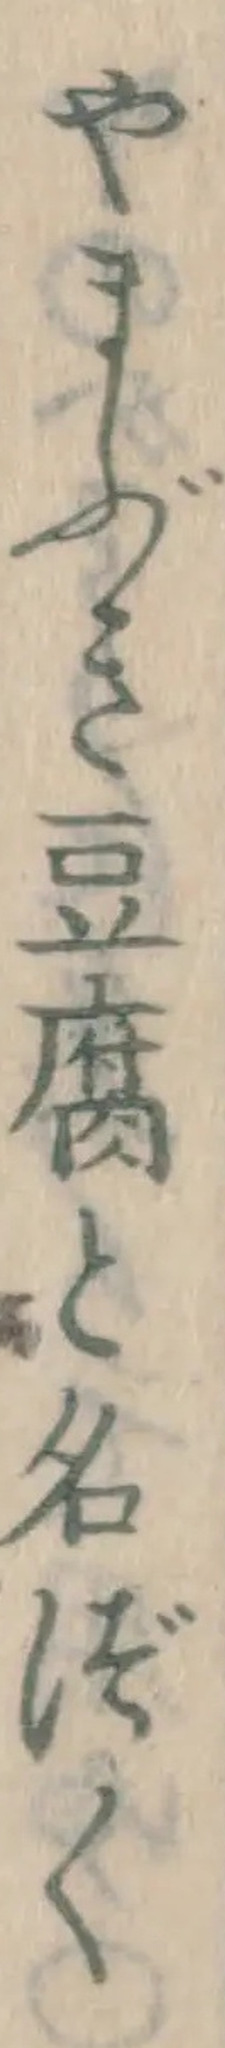やまぶき豆腐と名づく
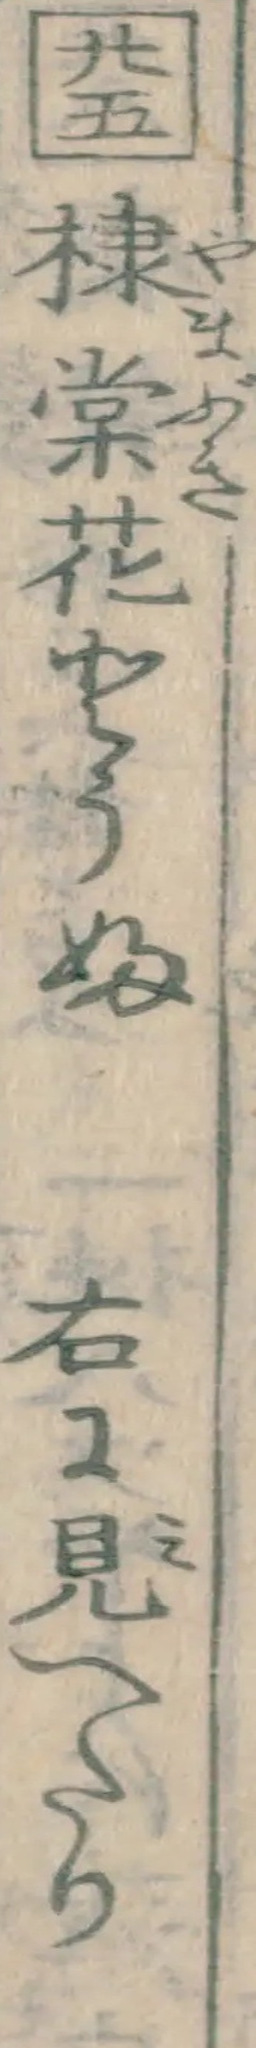廿五棣棠花とうふ右に見へたり
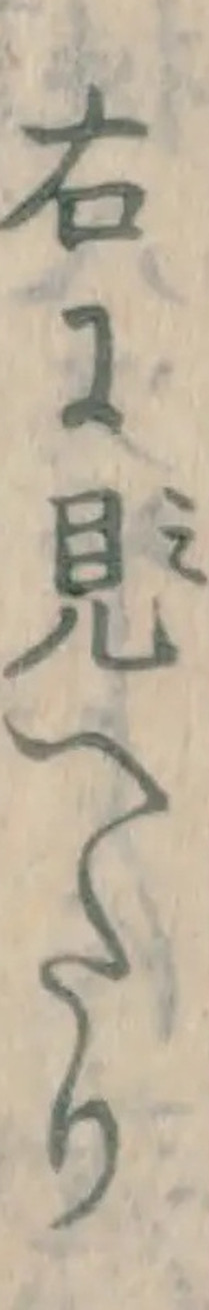に見へたり
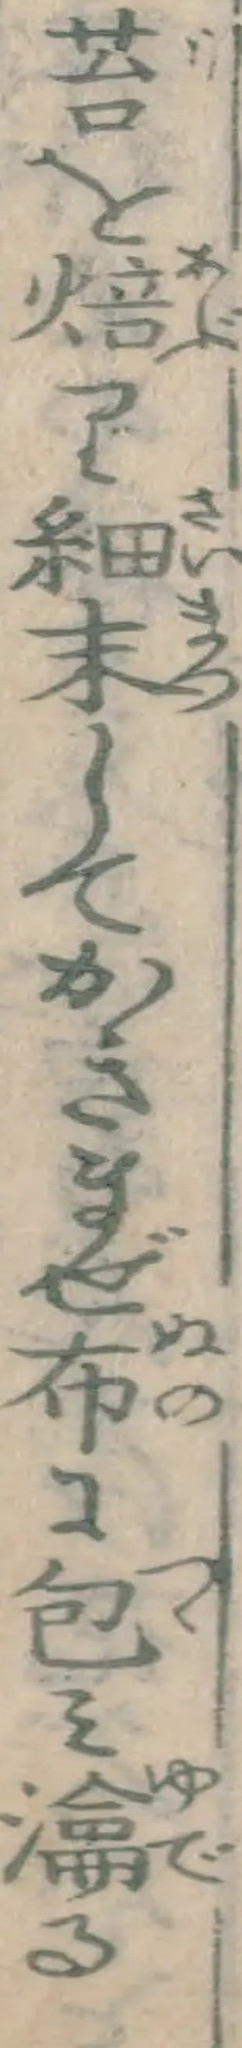苔を焙り細末してかきまぜ布に包み瀹る

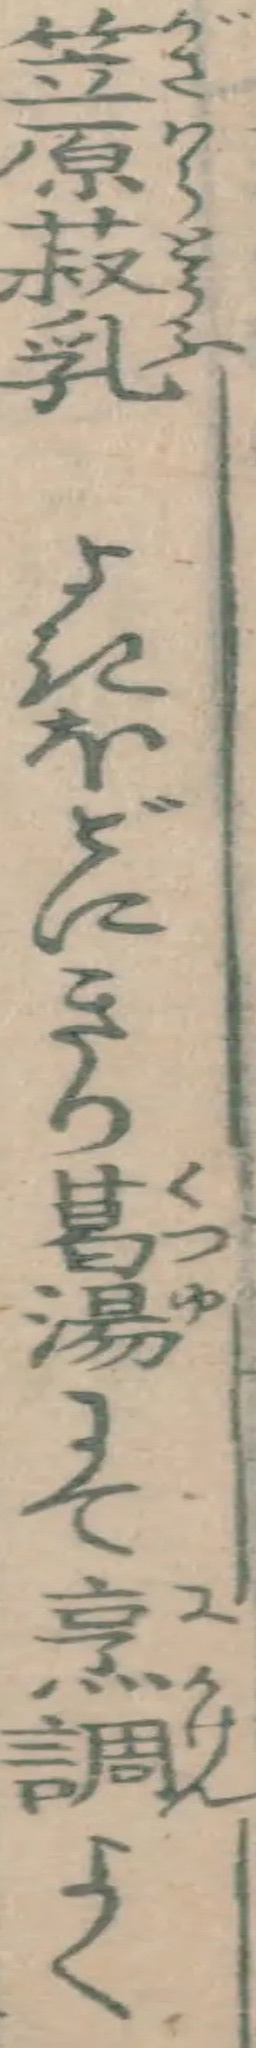廿七小笠原菽乳よきほどにきり葛湯にて烹調よく
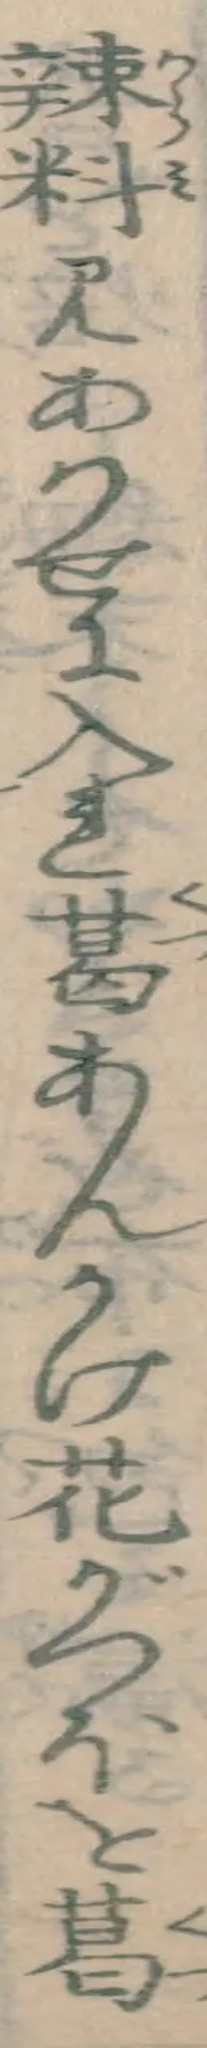辣味見あはせに入れ葛あんかけ花がつほを葛
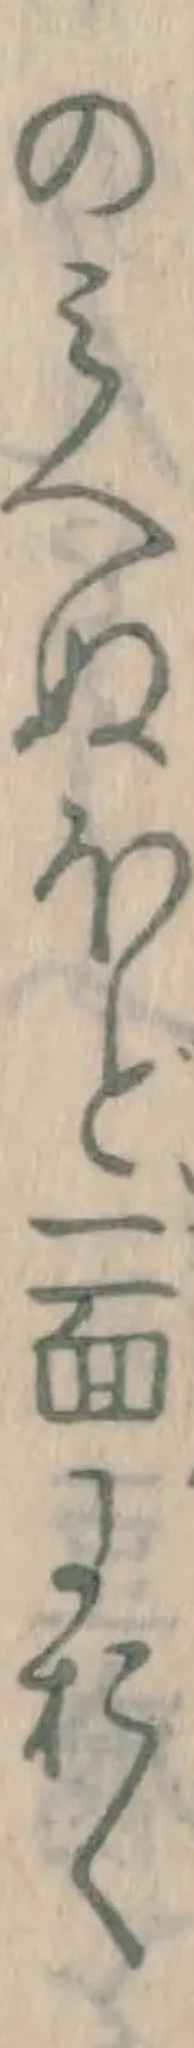のみへぬほど一面におく
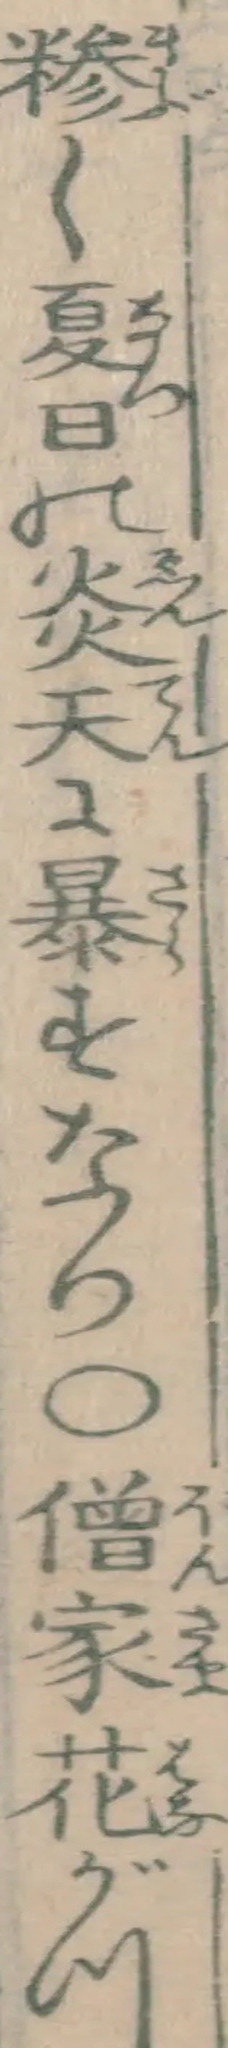糝し夏日の炎天に暴すなり○僧家花がつ
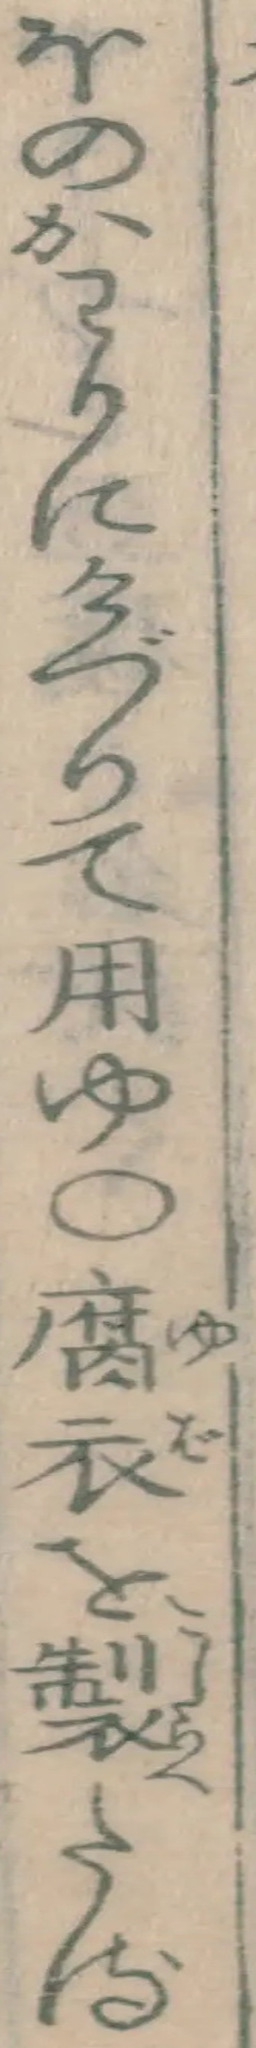ほのかわりにけづりて用ゆ○腐衣を製たる
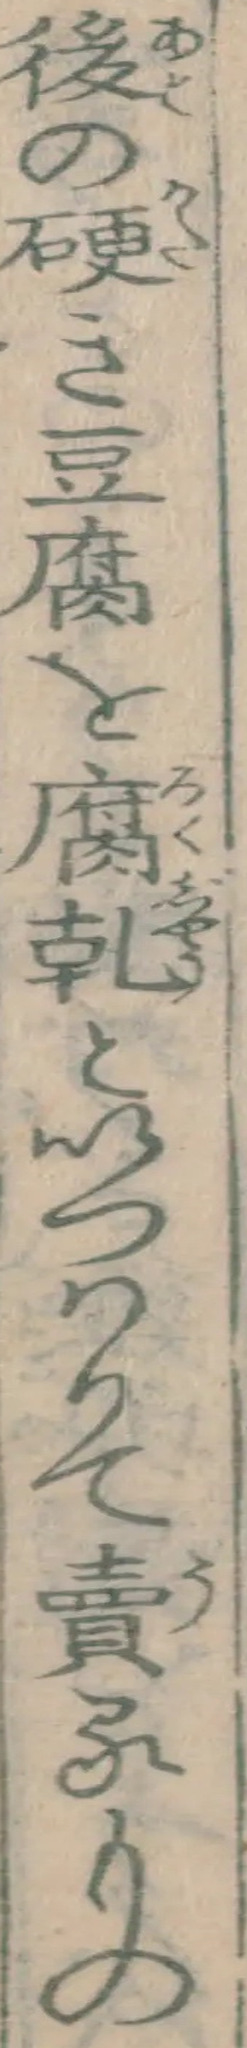後の硬き豆腐を腐乹といつはりて売るもの
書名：豆腐百珍. 続編
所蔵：国立国会図書館 National Diet Library, JAPAN
